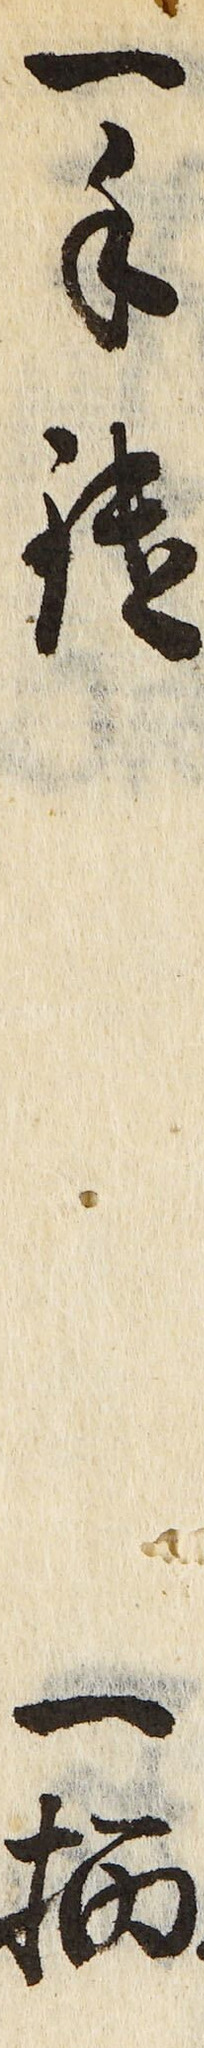一手鑓一柄
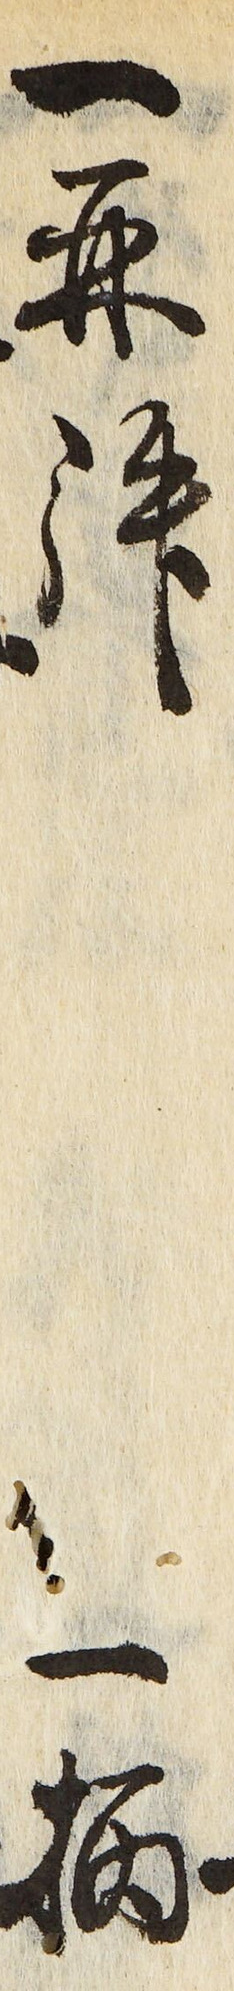一再拝一柄
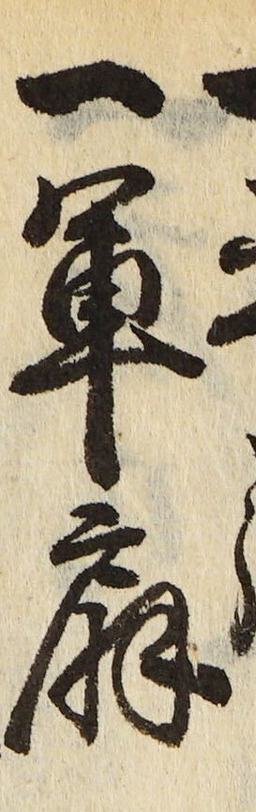一軍用
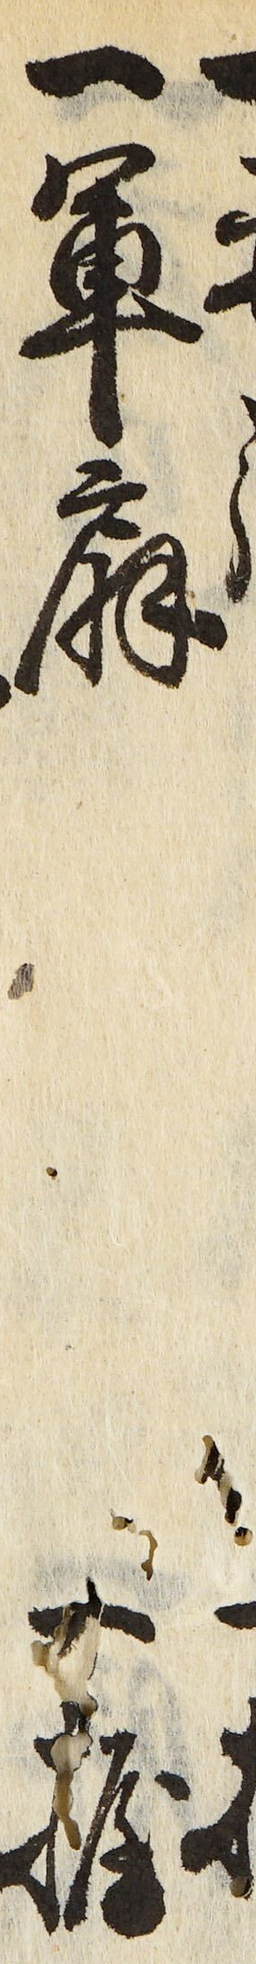一軍扇一渥
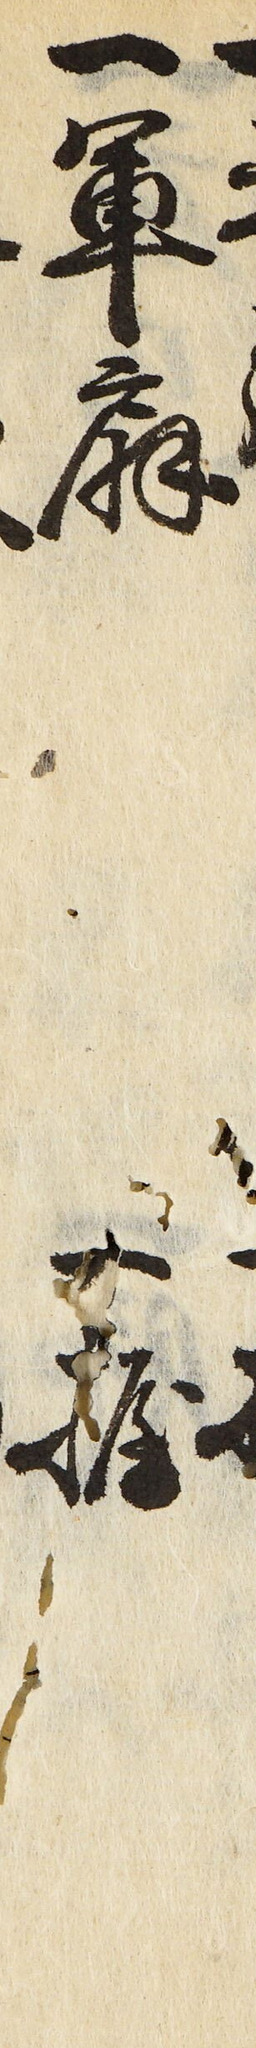一軍扇一渥
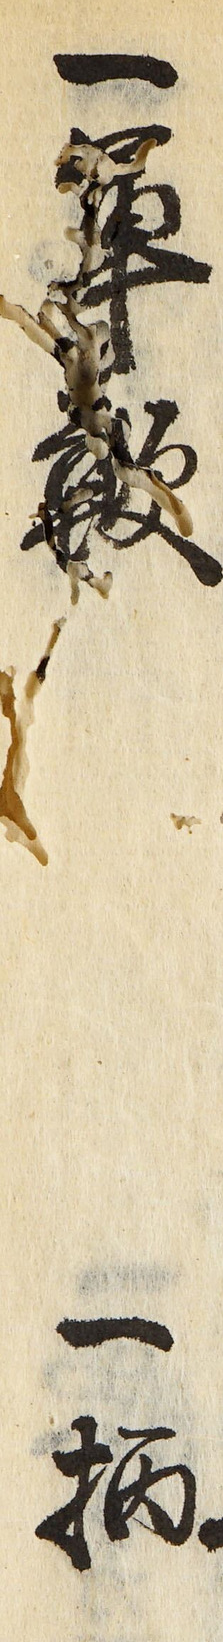一軍鞭一柄
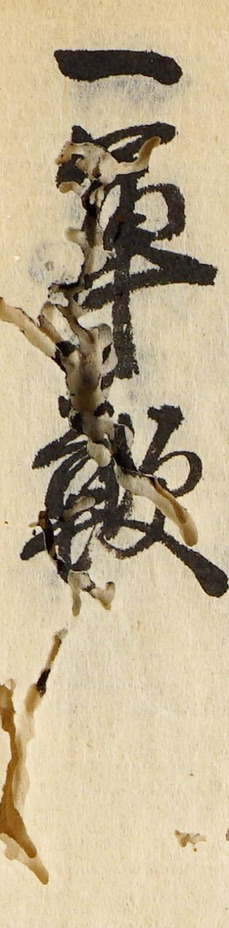一軍用
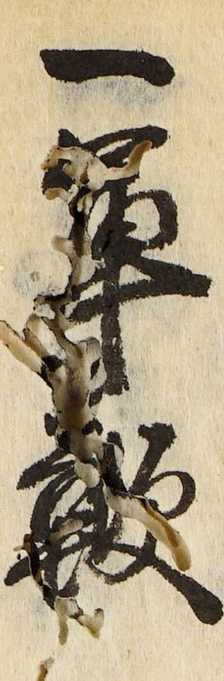一軍用

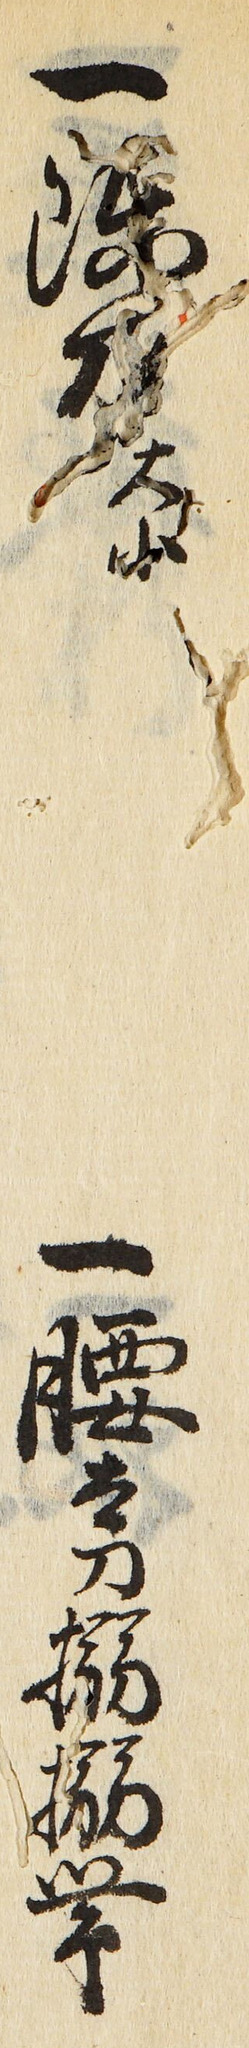一陣刀大小一腰太刀搦搦帯
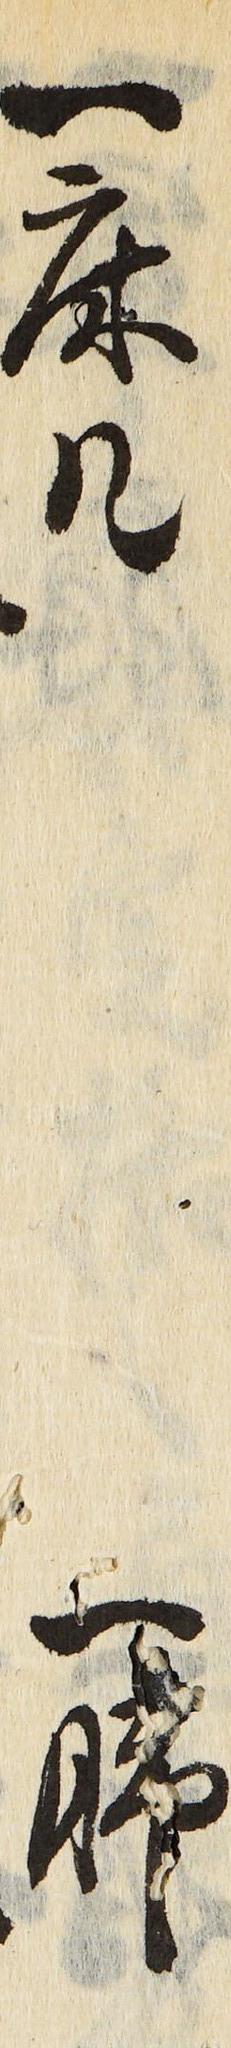一床几一脚
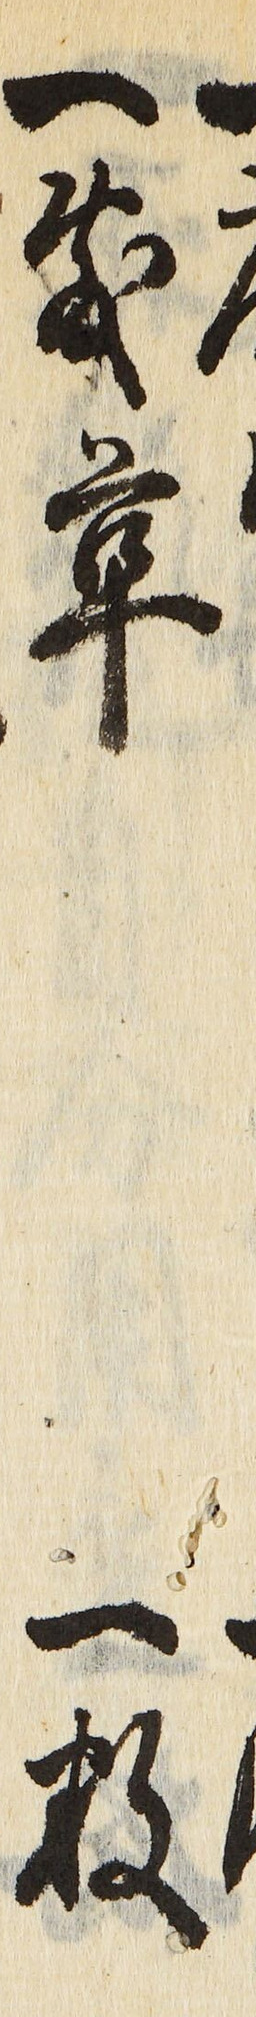一敷革一枚
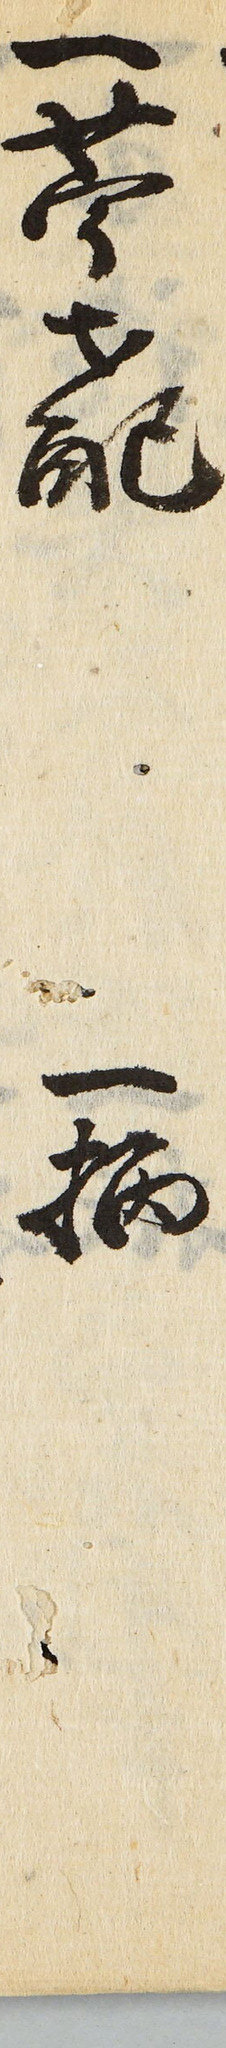一苧才配一柄
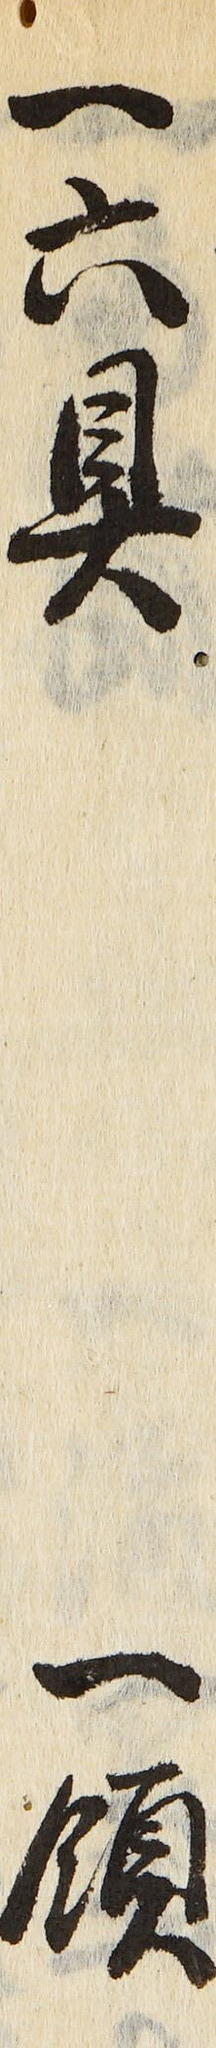一六具一領
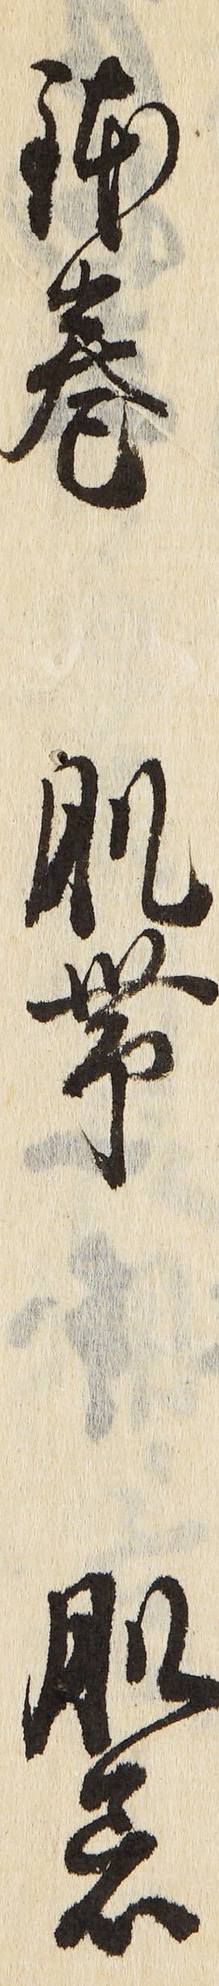鉢巻肌帯肌着
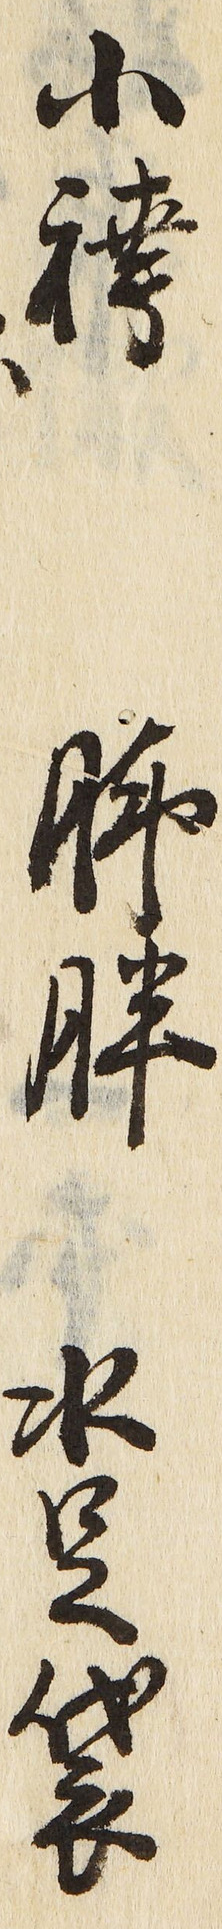小袴脚胖水足袋
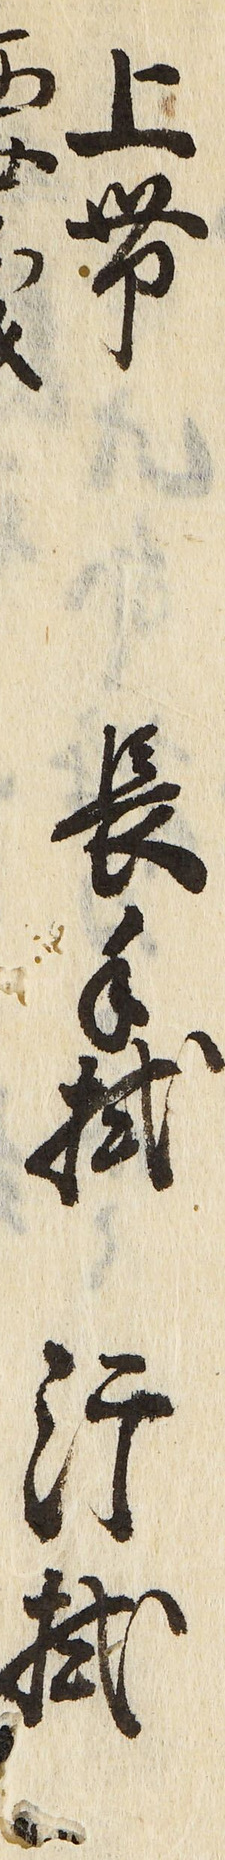上帯長手拭汗拭
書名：御領海江異国船漂流有之節御手当之次第大組頭心得之廉々書集記
